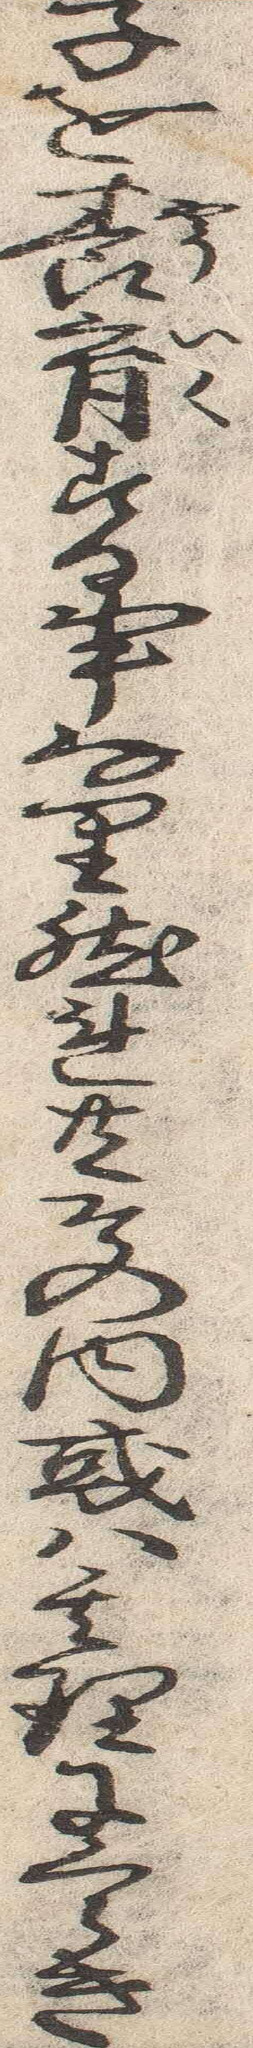子を養育する事なり然れ共その内或は其理にくらき
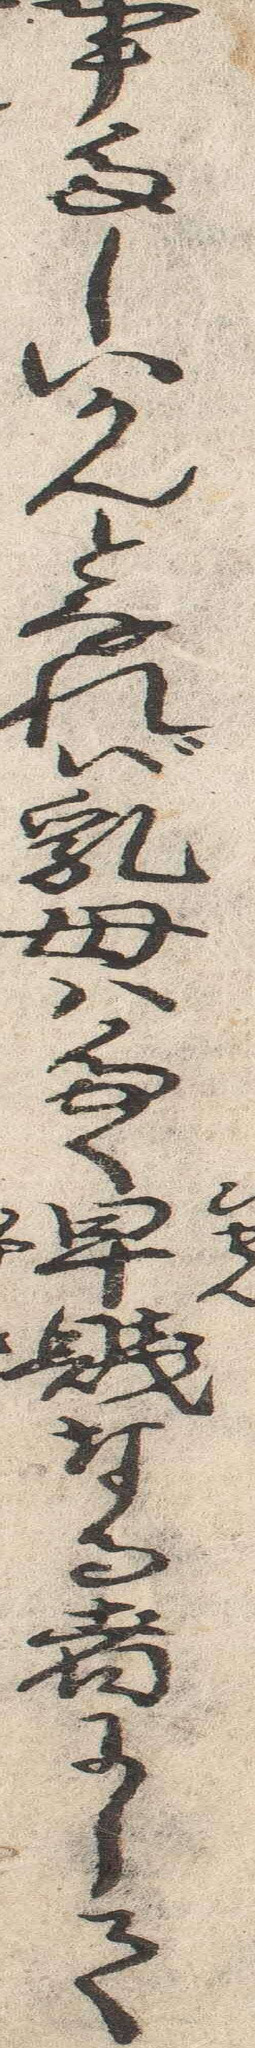事多しいかんとなれば乳母は多く卑賎なる者にして
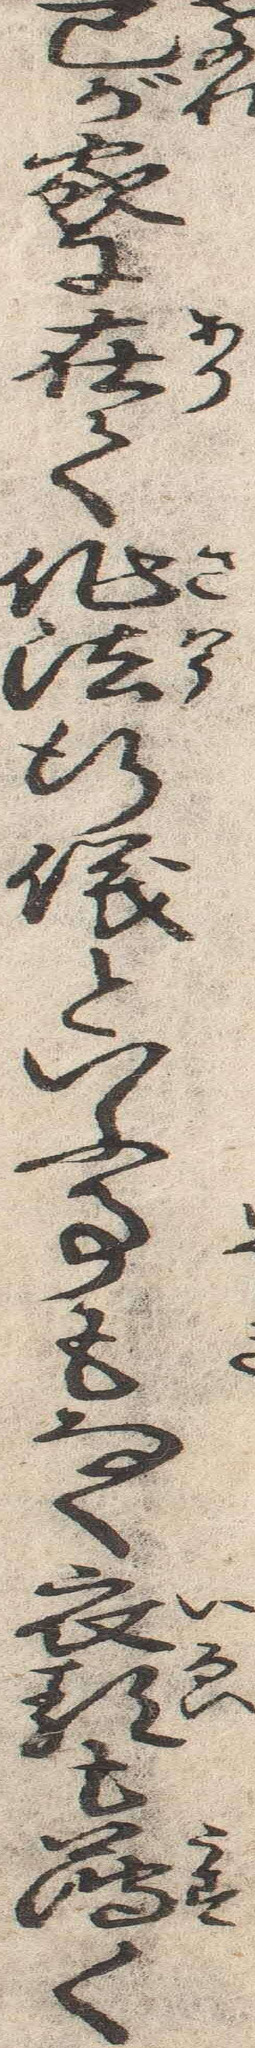己が家に在て作法行儀といふ事もなく衣類も薄く
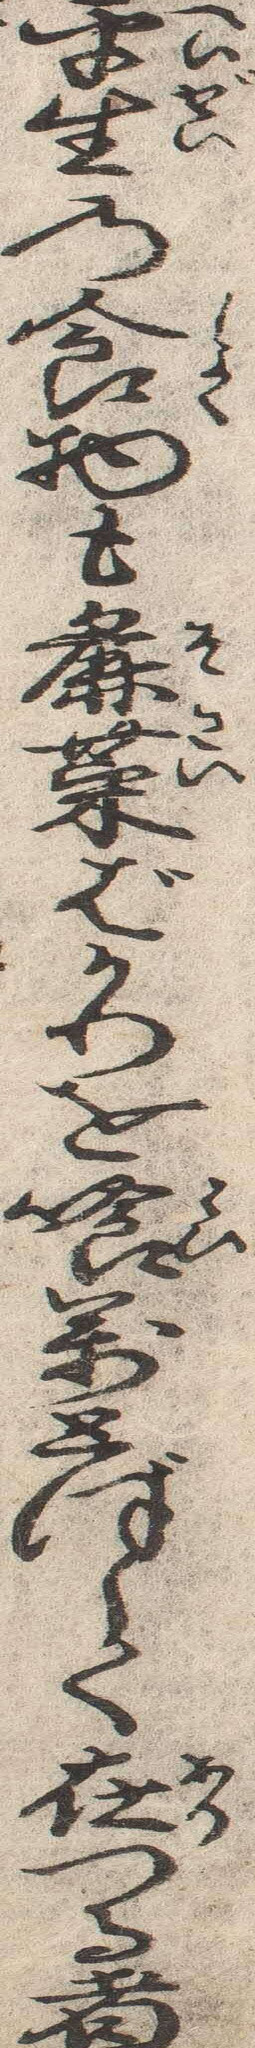平生の食物も麁菜ばかりを喰萬とぼしく在つる者
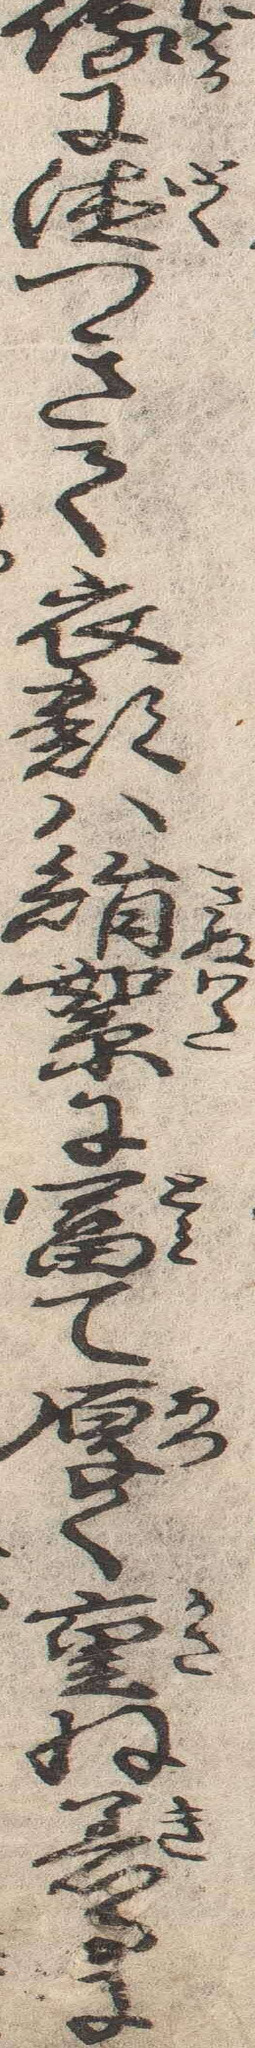俄に徳つきて衣類は絹絮に冨て厚く重ね着るに
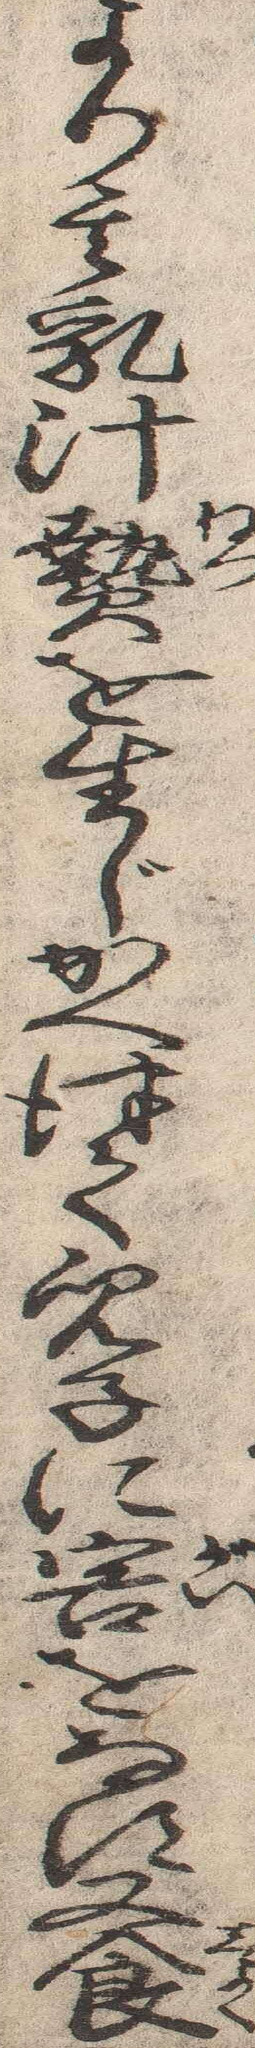より其乳汁熱を生じかへつて児子に害をなす又食

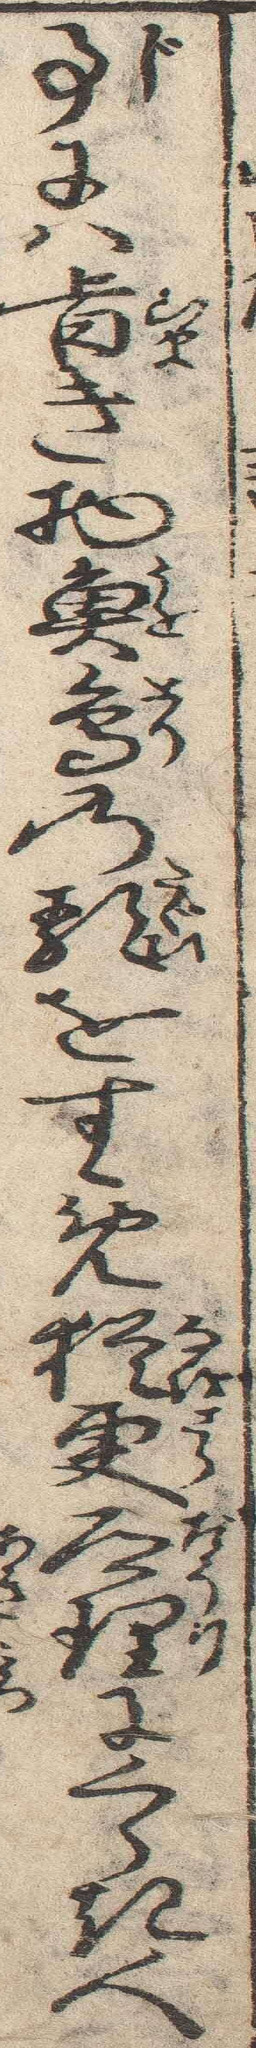事には旨き物魚鳥の類をすゝめ猶更道理にくらき人
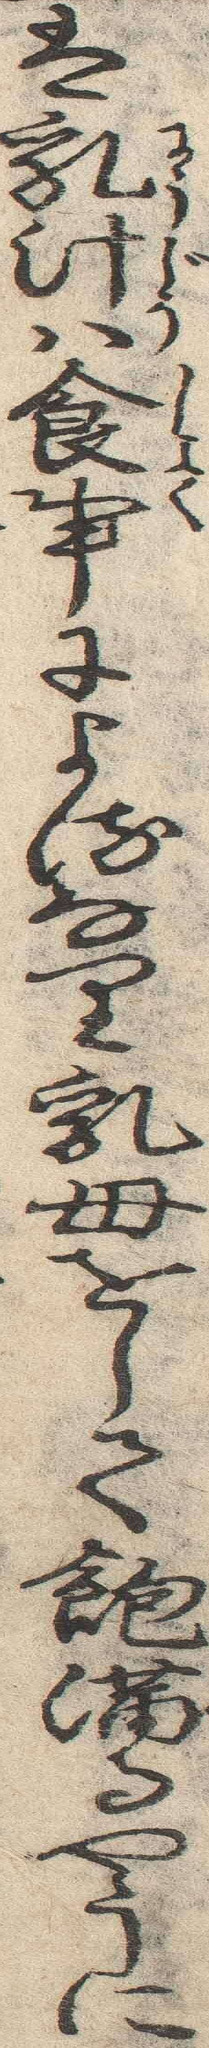は乳汁は食事によるなり乳母をして飽満るやうに
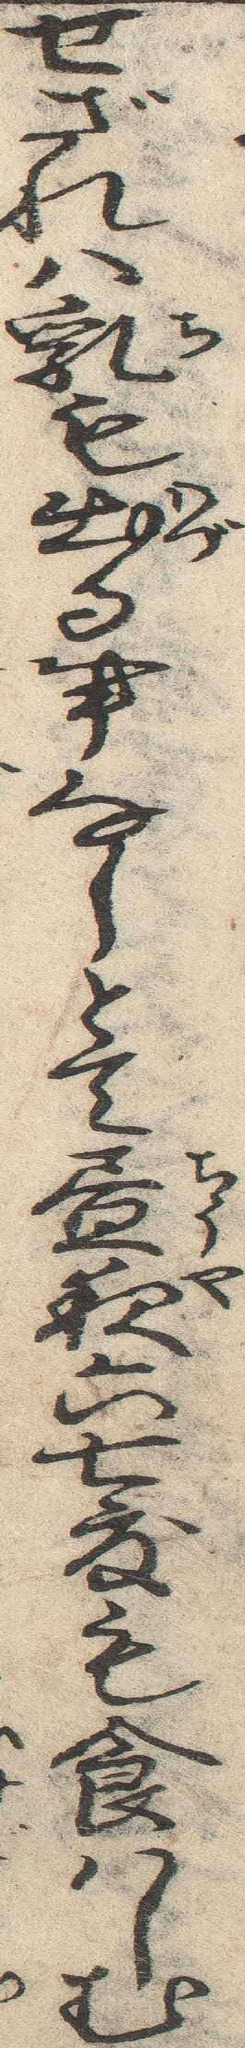せざれは乳も出る事なしとて昼夜六七度も食はしむ
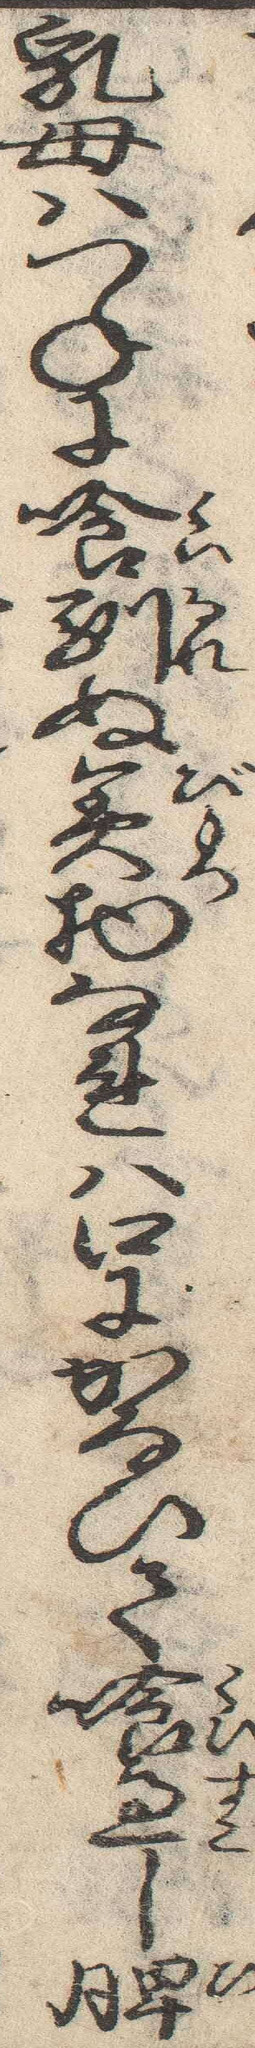乳母はつねに喰馴ぬ美物なれは口にかなひて喰過し脾
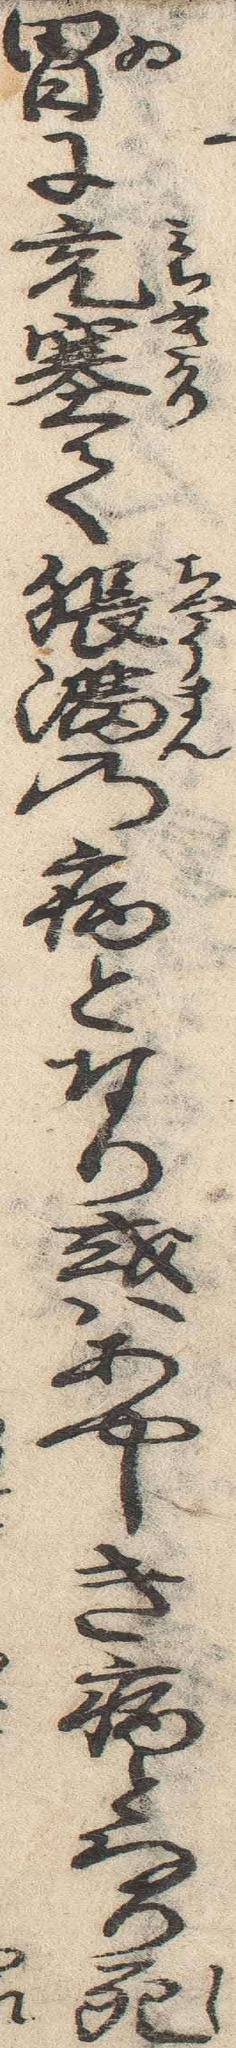胃に充塞て脹満の病となり或はあやしき病となり死
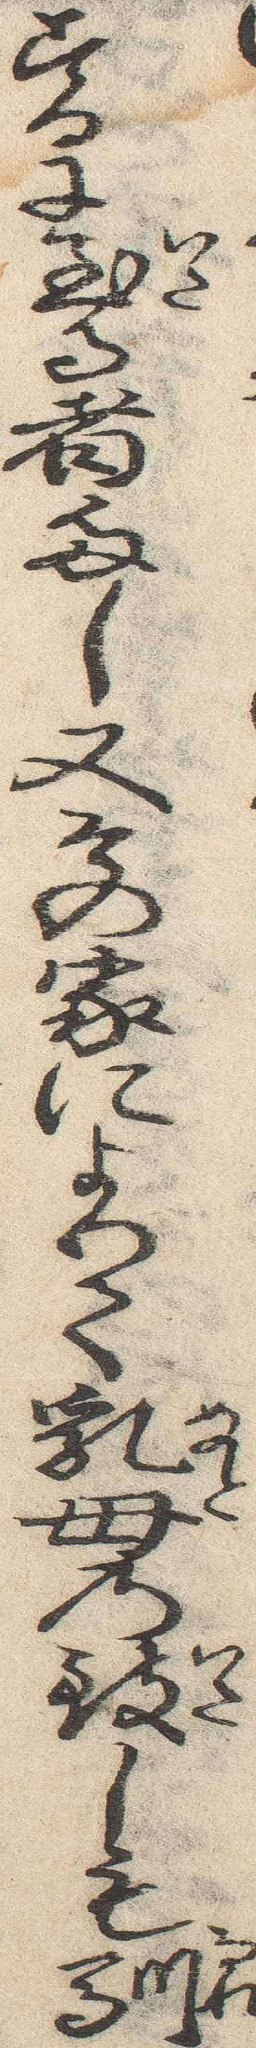するに至る者多し又その家によりて乳母の致しも馴
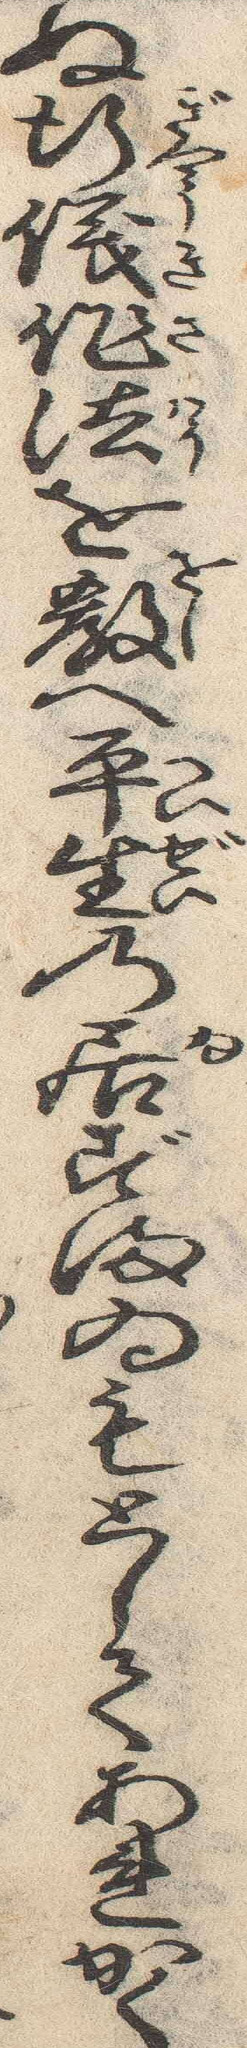ぬ行儀作法を教へ平生の居ずまゐもとしてあれかく
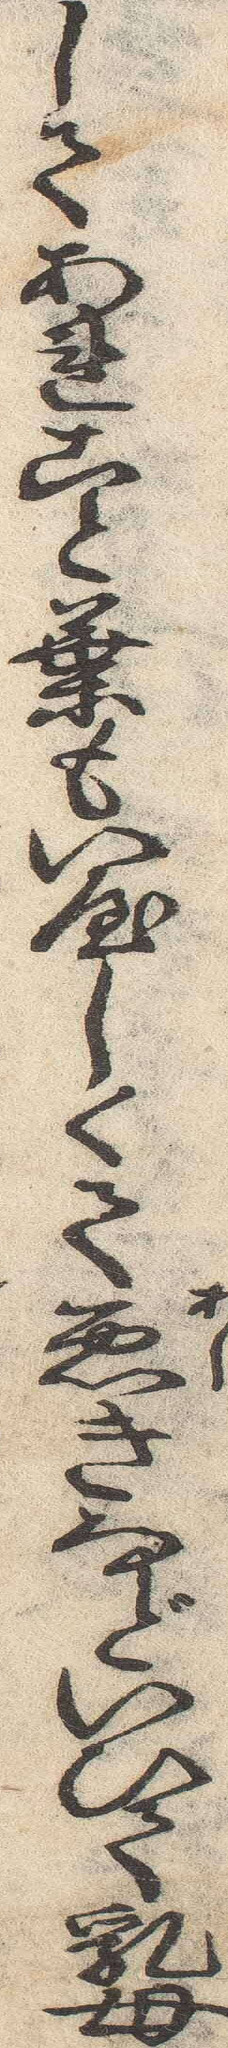してあれこと葉もいやしくて悪きなどいひて乳母
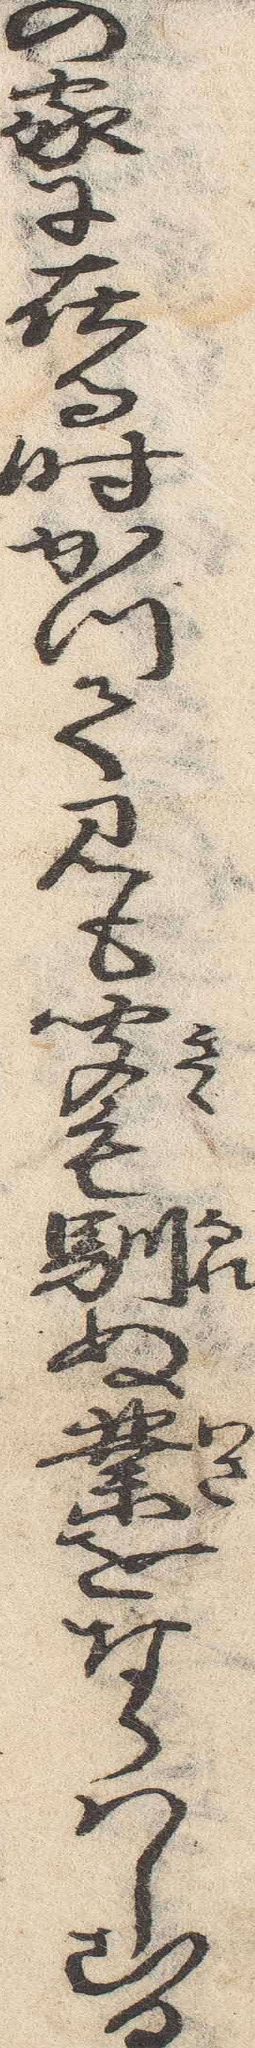の家に在る時かつて見も聞も馴ぬ業をならはしむる
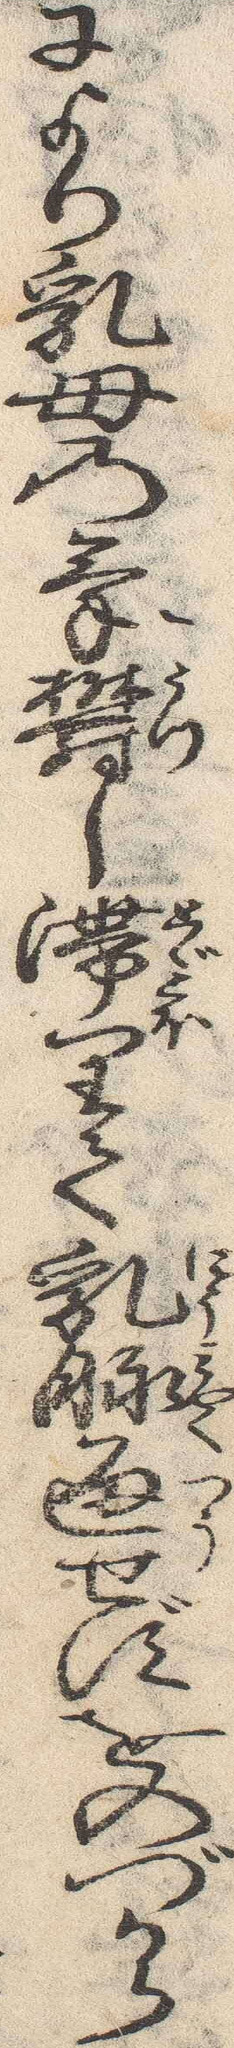により乳母の気鬱し滞りて乳脉通せずをのづから
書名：小児必用養育草
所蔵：東京学芸大学附属図書館 国文学研究資料館
